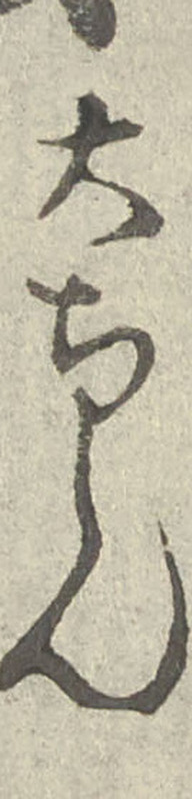大ちしん
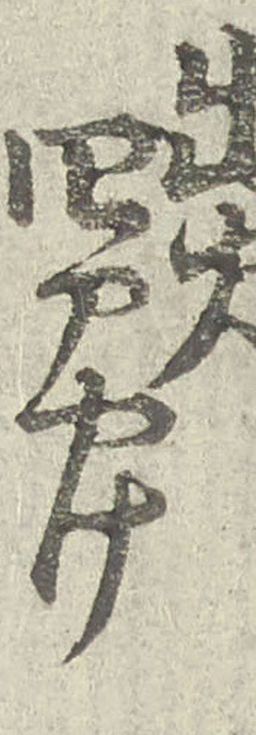四部やけ
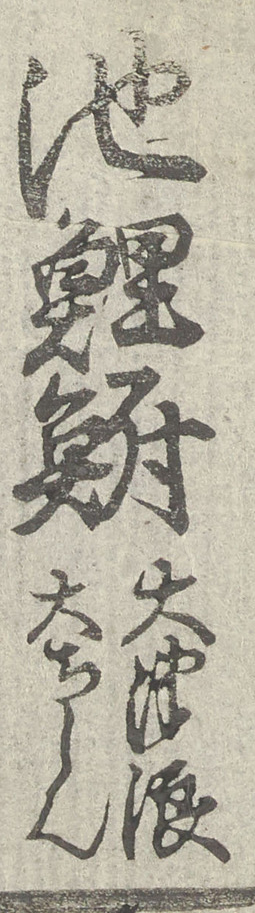池鯉鮒大津浪
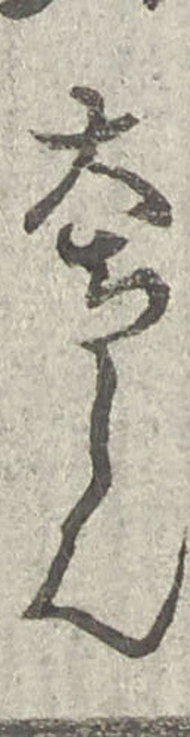大ちしん
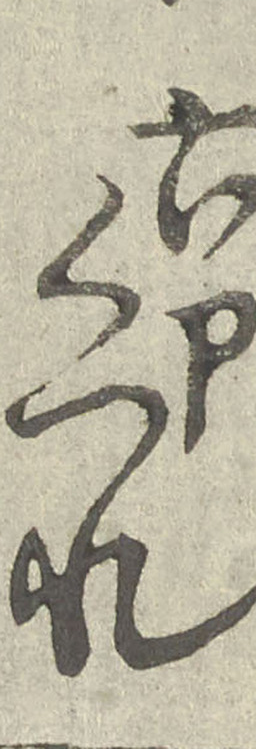くつれ
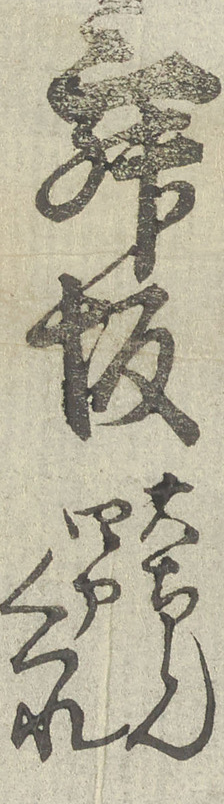舞坂大ちしん
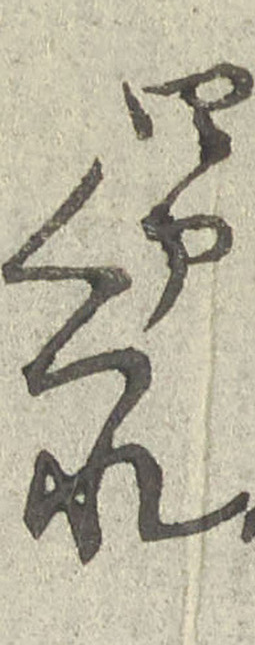くつれ
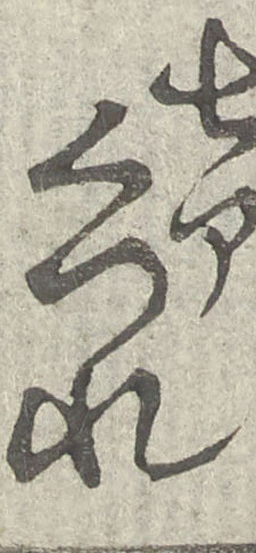くづれ
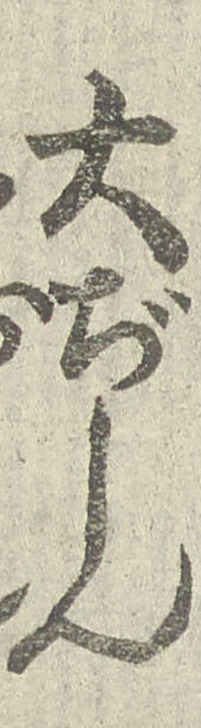大ぢしん
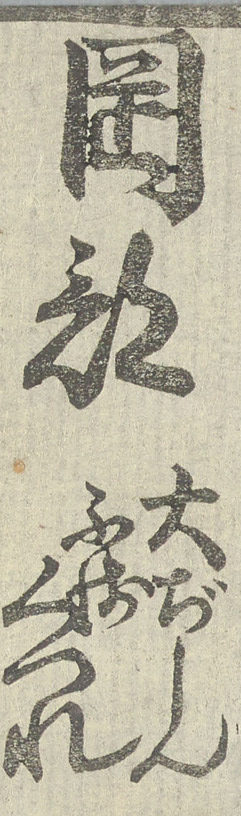岡部大ぢしん
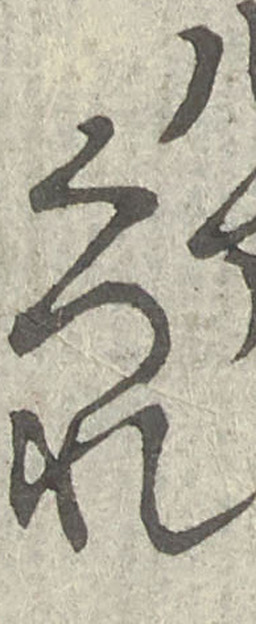くつれ
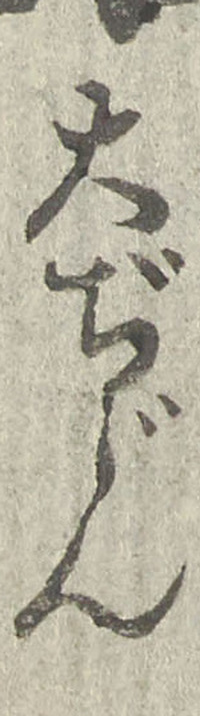大ぢしん
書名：東海道大地震津波出火
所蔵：東京大学総合図書館 General Library in the University of Tokyo, JAPAN
